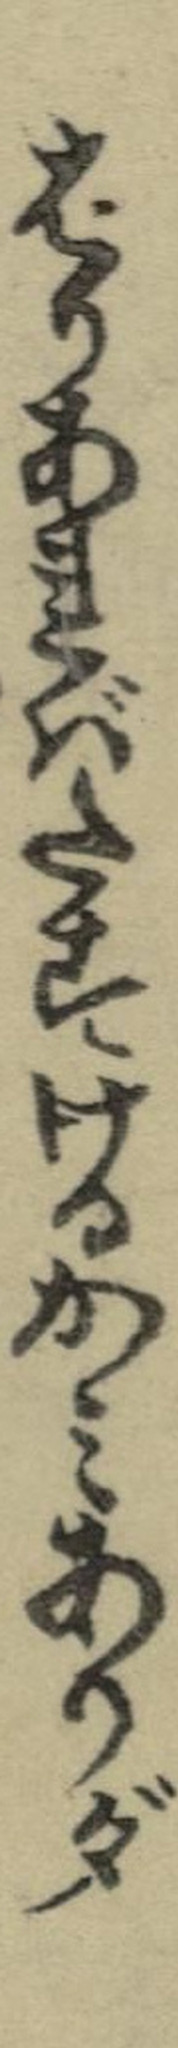はりあればたすけるかみありダ
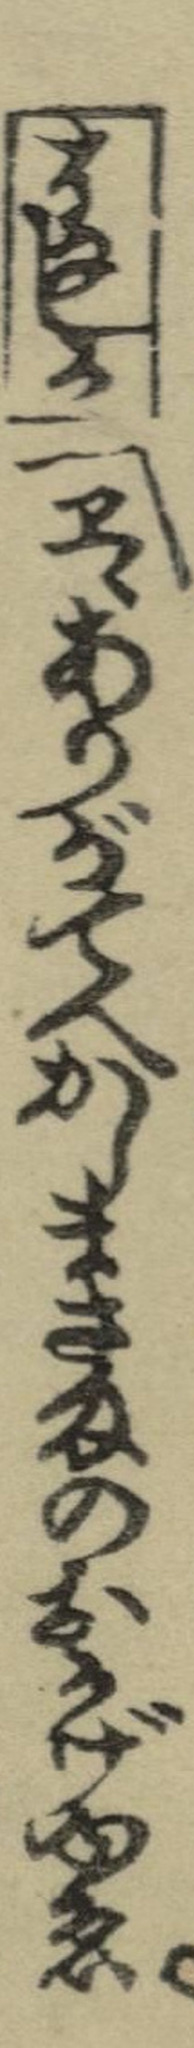はなしか〽ヱヽありがてへかしまさまのおかげゆゑ
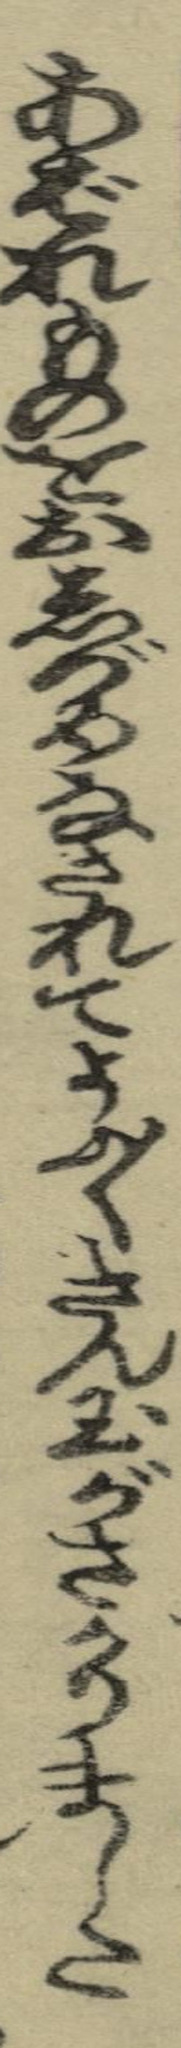あばれものをおしづめなされてよふ〳〵きん玉がさがりました
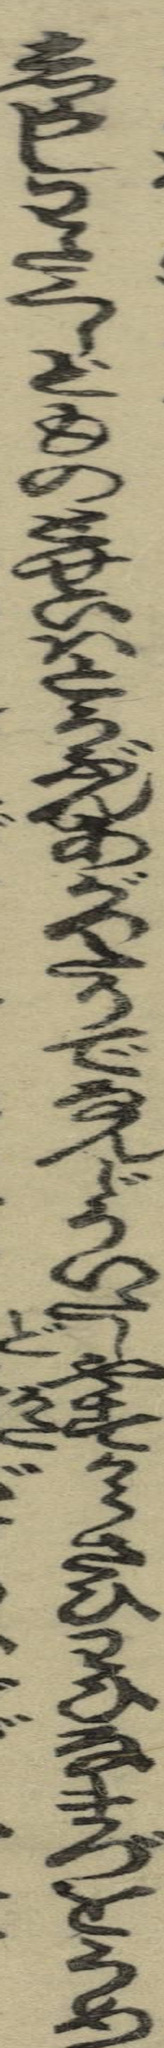しかしわたくしどものとせいはとうぶんあがつたりでなんじういたしやすからさひわひなまづをうめ
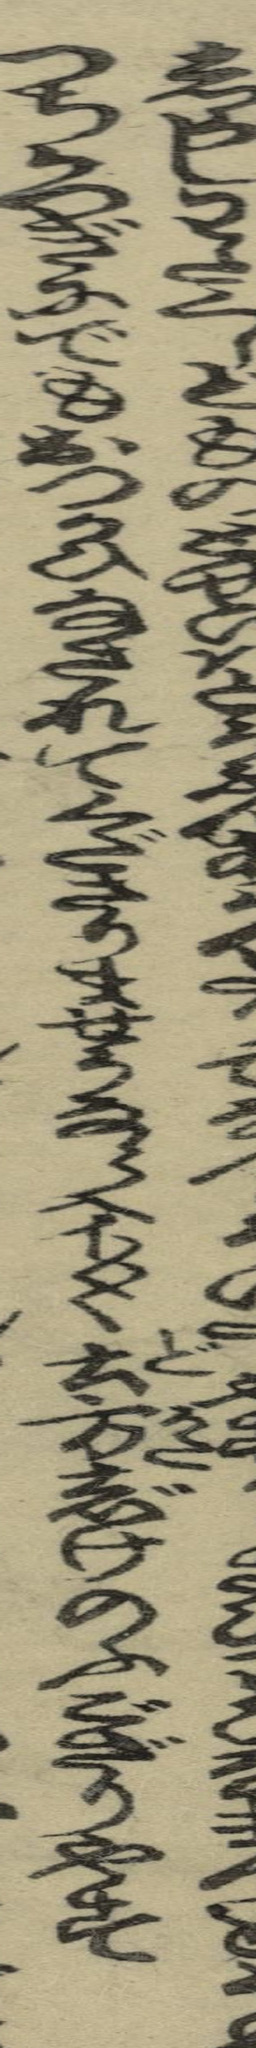つちかつぎにでもおつかひなされてくださりませうならヘイ〳〵〳〵土方じけのふござりやす
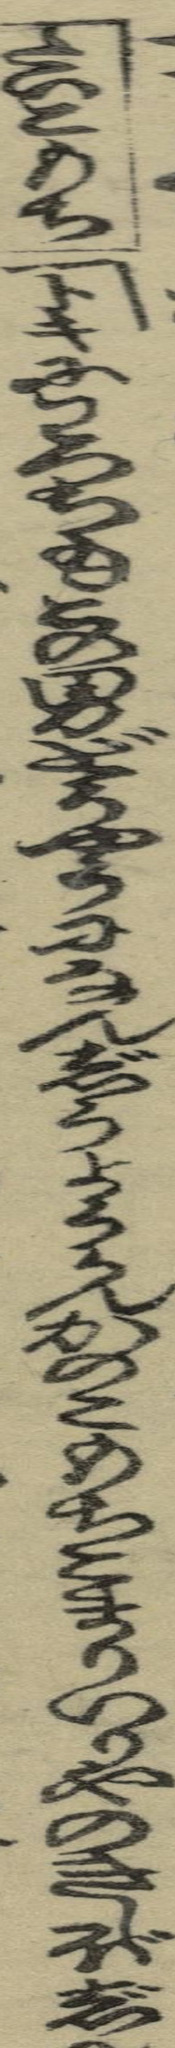たいこもち〽トキにわつちもこの男どうやうになんじうようかんかのこもちこまりいもやのきじぼじん
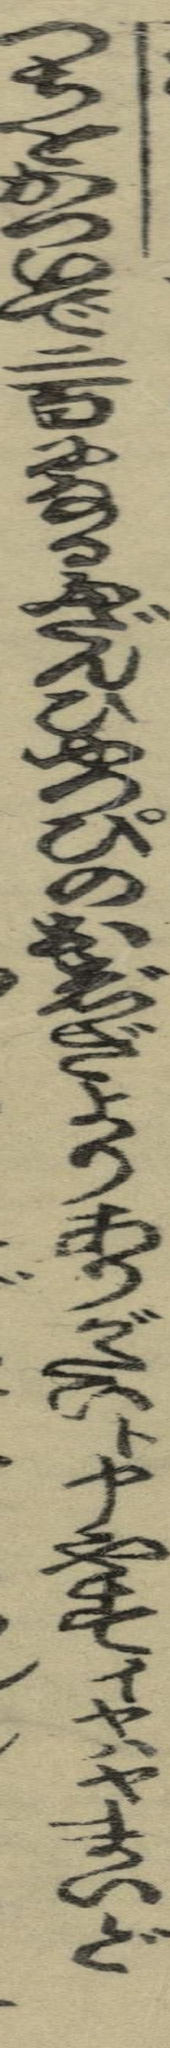つちをかついで二百になるふだんひやつぴのおじぎよりありがたいト申やすイヤハヤまいど
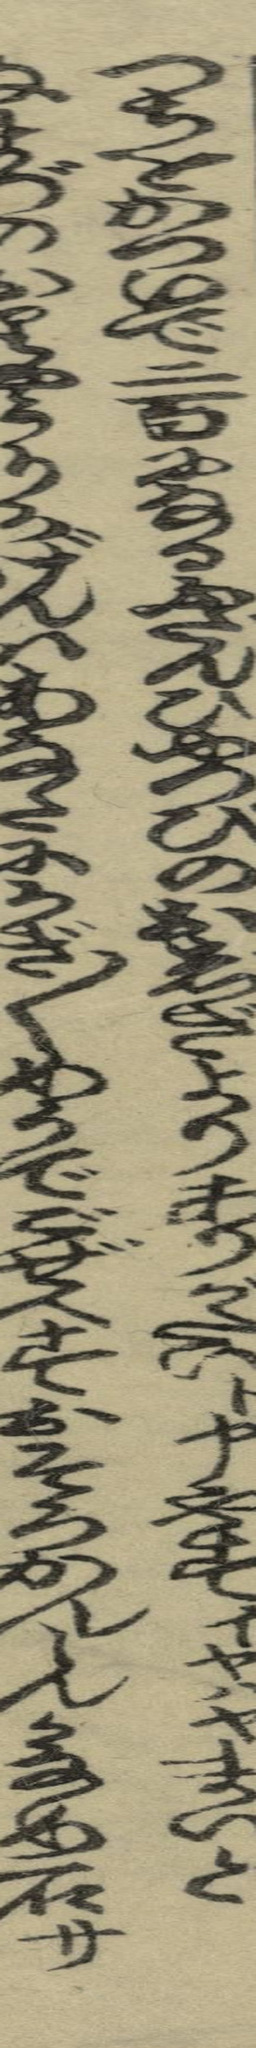なまづのおりやうりかげんはあなたにかぎ〳〵めうでごぜへすおそろかんしんかなめ石サ
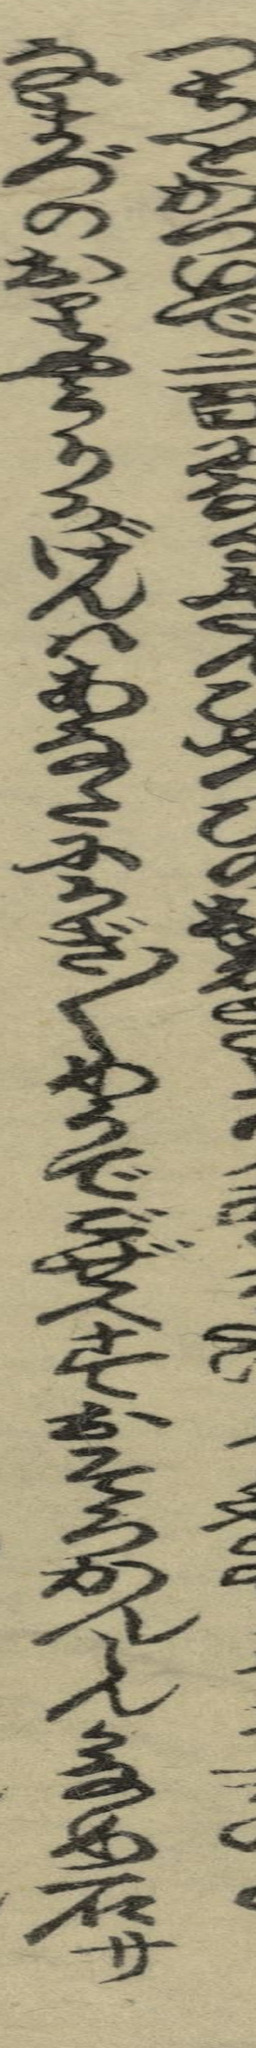なまづのおりやうりかげんはあなたにかぎ〳〵めうでごぜへすおそろかんしんかなめ石サ
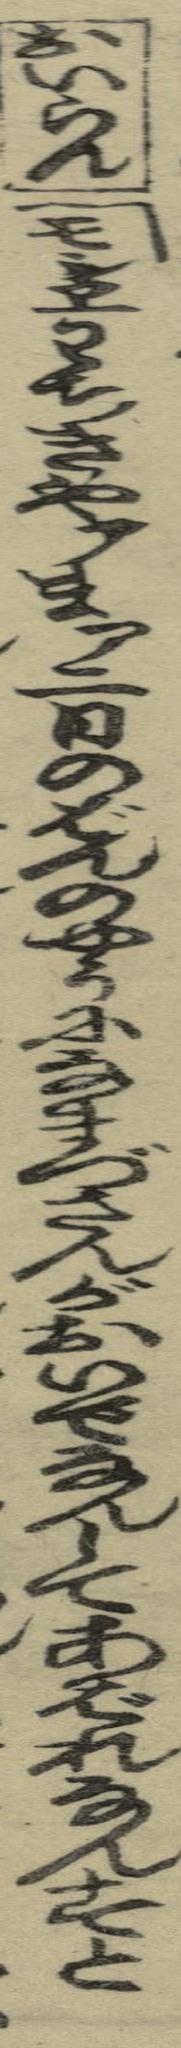おいらん〽モシヱわちきやアまア二日のばんのやうになまづさんがおいでなんしてあばれなんすと
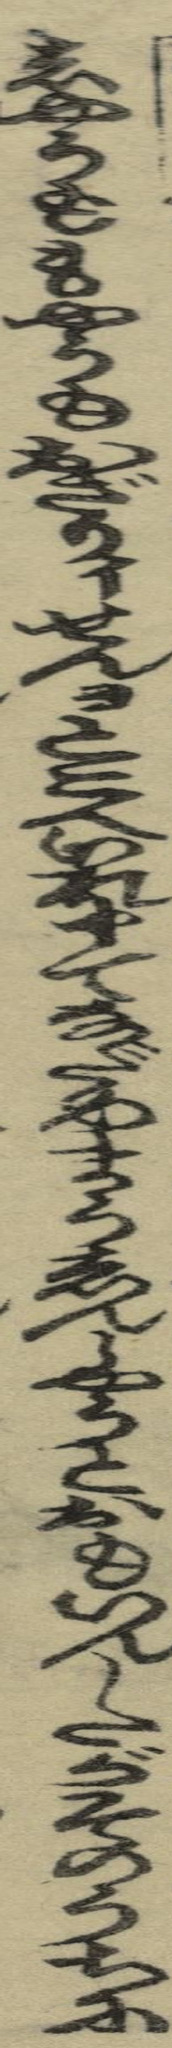しやうももやうもおざりイせんヨとこへいれ申てなだめまうしんしやうとおもいんしたがそのうちに
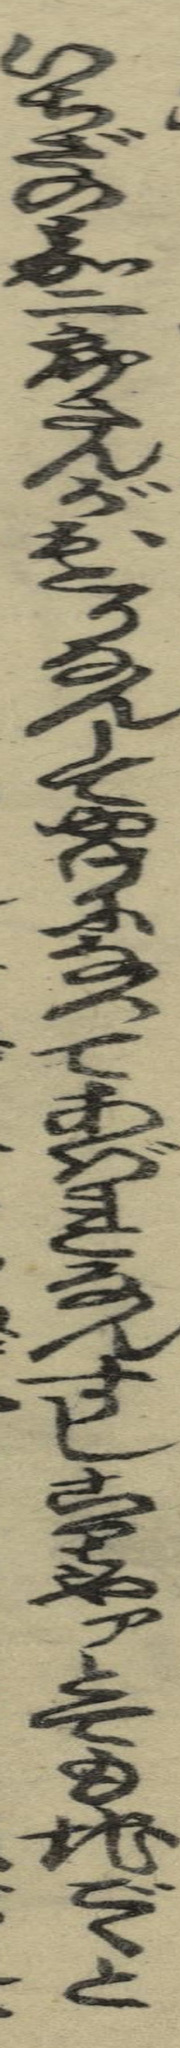いちざの嘉二郎さんがおとりなんしてやけになつてあばれなんすしこりやアとても地ごくと
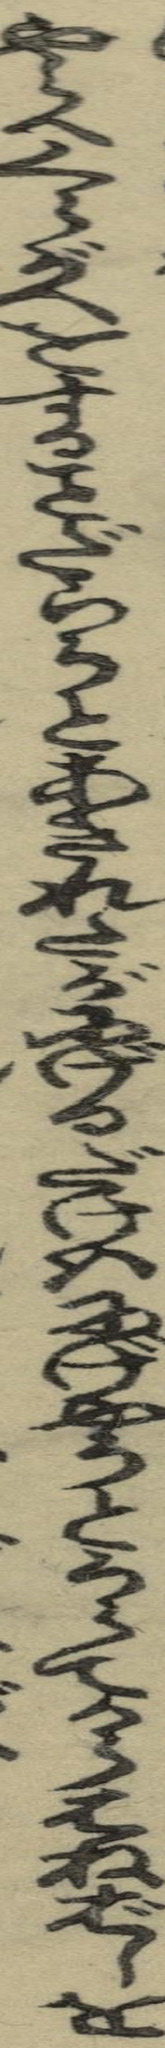やみへくらがへをすることだらうとあきれたがにげるだけはにげやうとうらてからはねばしを
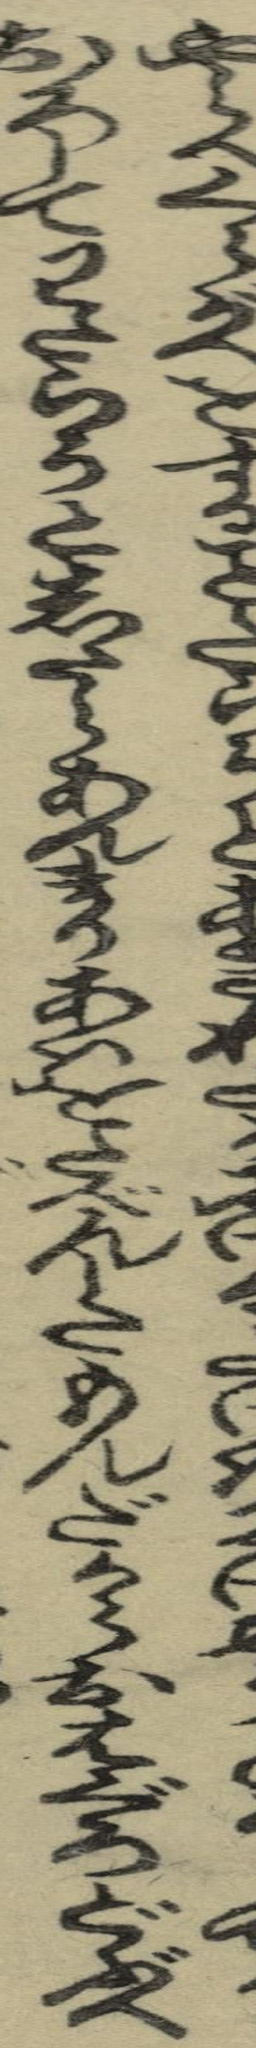おろしてわたらうとしたらあんまりあはをたべんしたもんだからおはぐろどぶへ
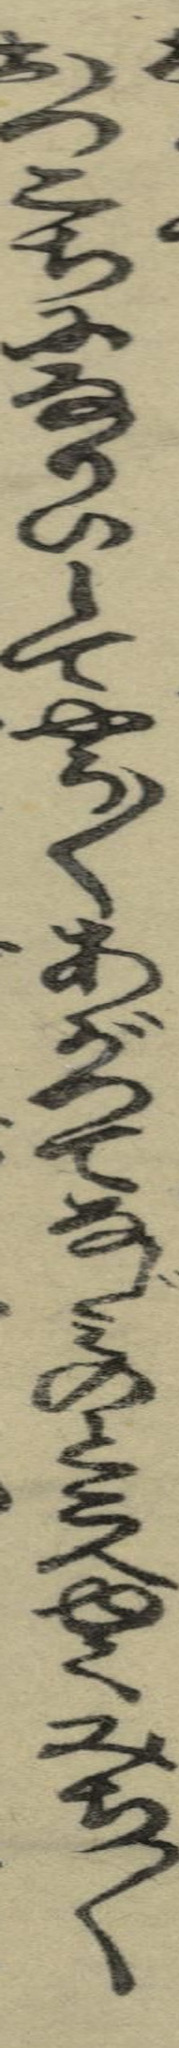おつこちになりいしてやう〳〵あがつてなじみのとこへゆくみち〳〵
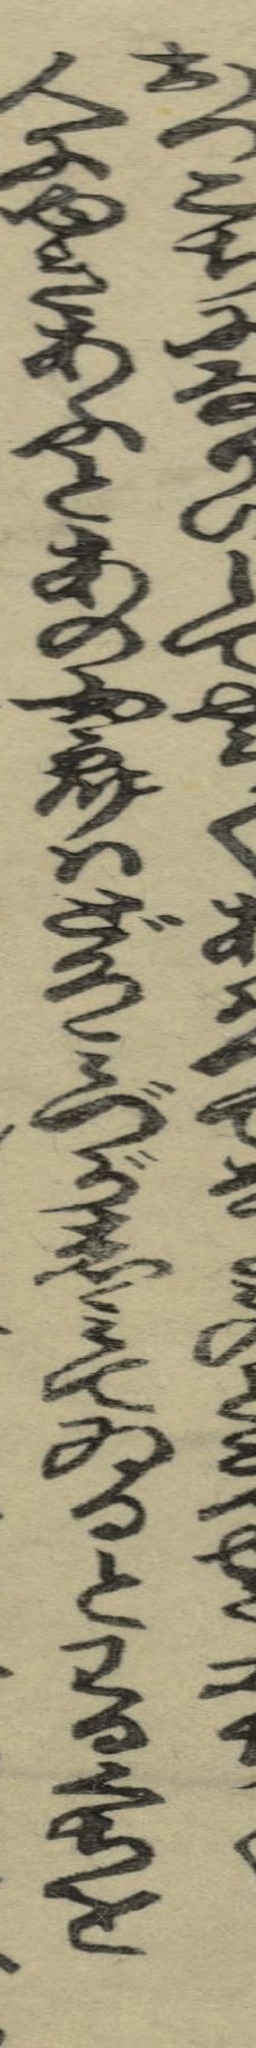人にゆきあふとあの女郎はどろみづがしみてゐるとわるくちを
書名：おそろ感心要石
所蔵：東京大学地震研究所図書室 Earthquake Research Institute Library, The University of Tokyo, JAPAN
